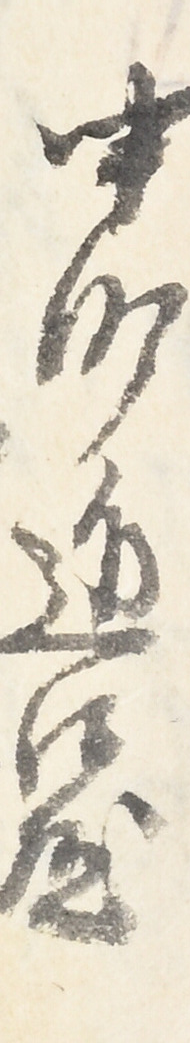中町近江屋
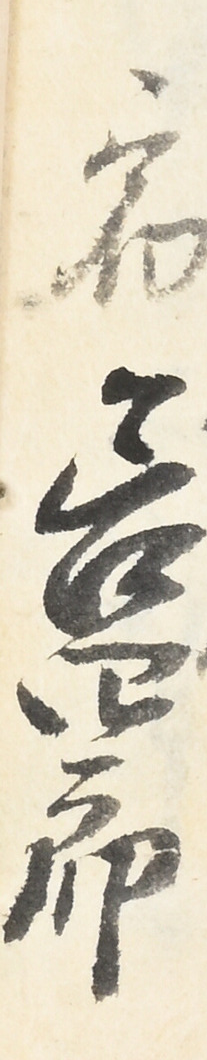宿善四郎
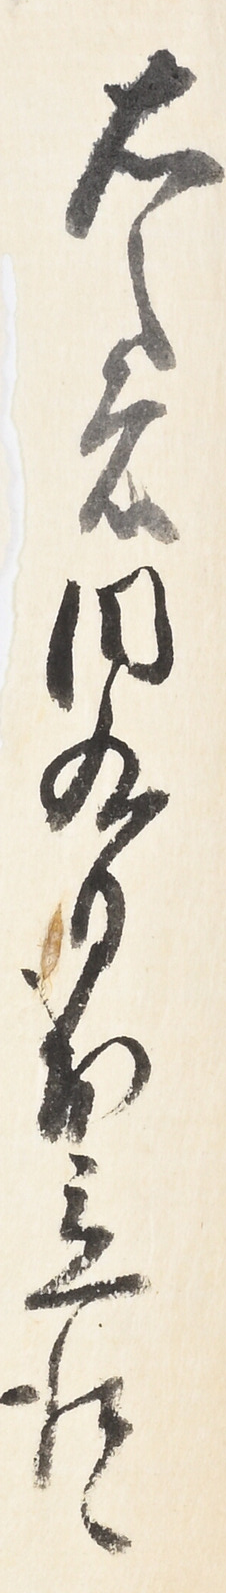右之者同九日出立仕候
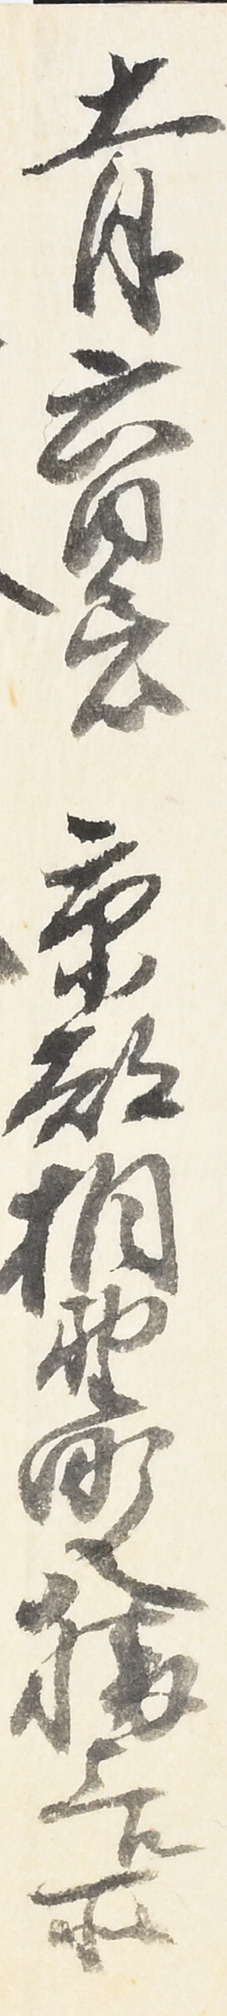十一月六日着京都相野町八幡上ル所
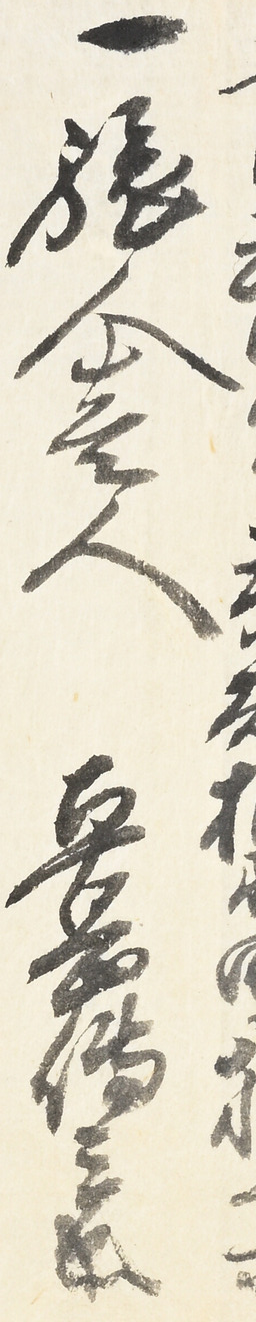一旅人壱人平岡伝兵衛
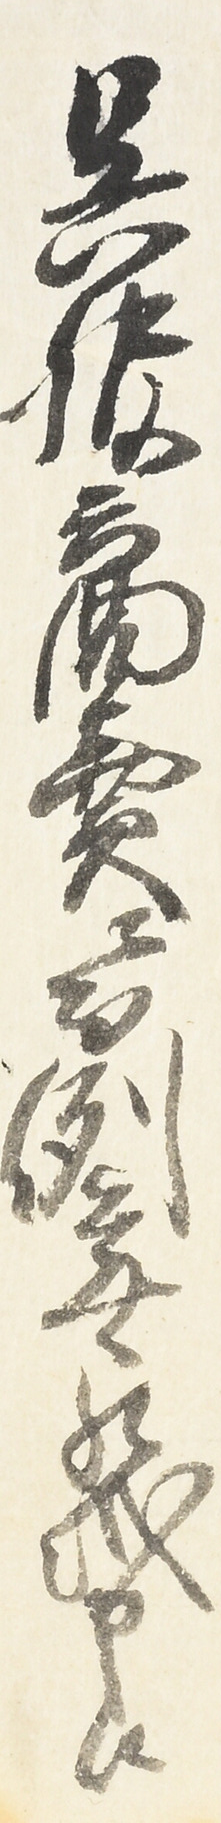呉服商売ニ而例年罷越申候
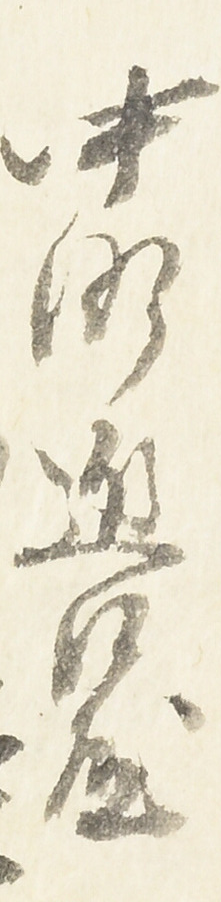中町近江屋
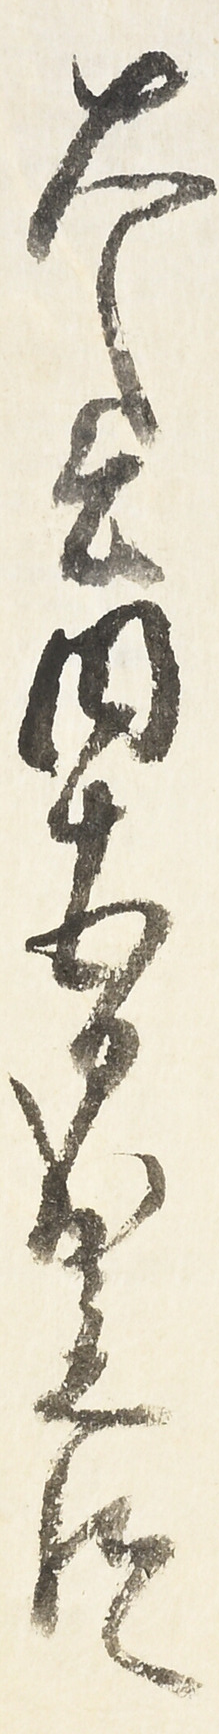右之者同十五日出立仕候
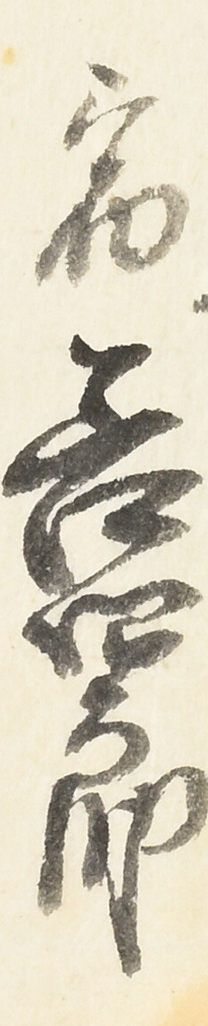宿善四郎
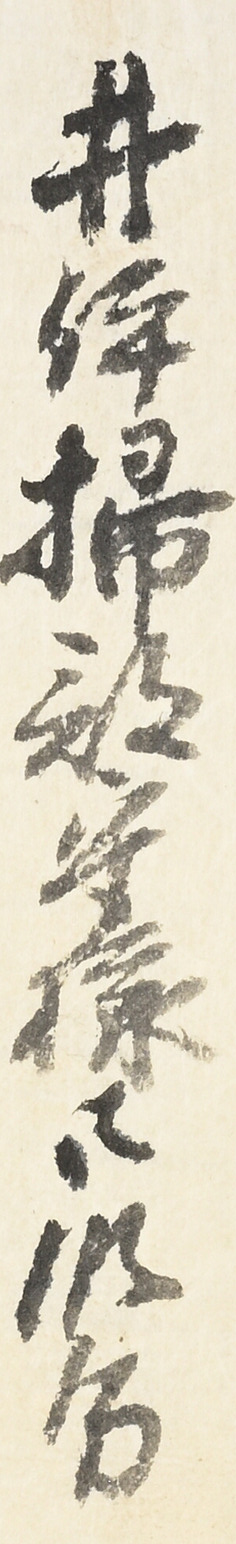井伊掃部頭様御領分
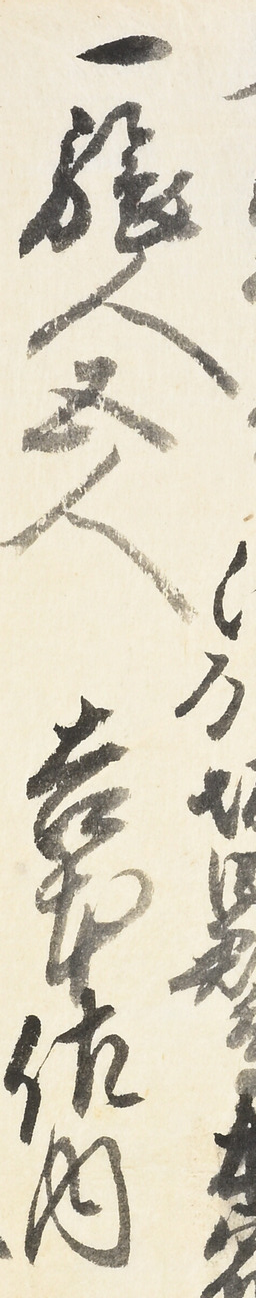一旅人五人吉本佐内
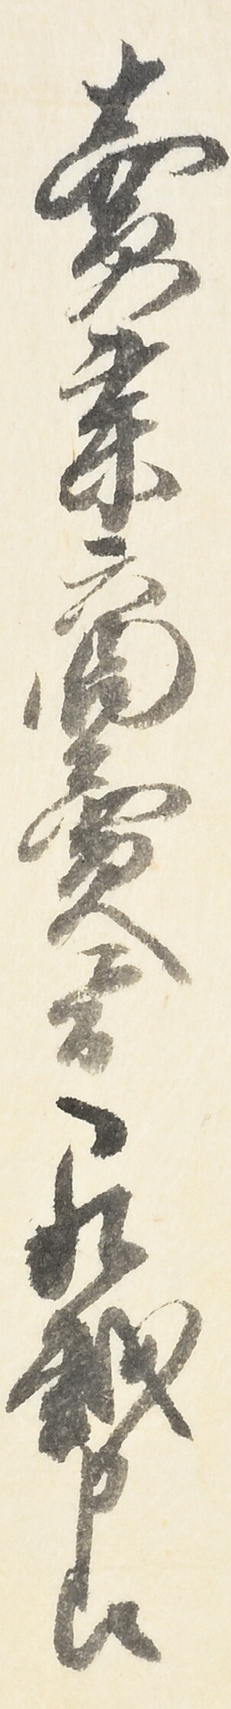売薬商売ニ而罷越申候
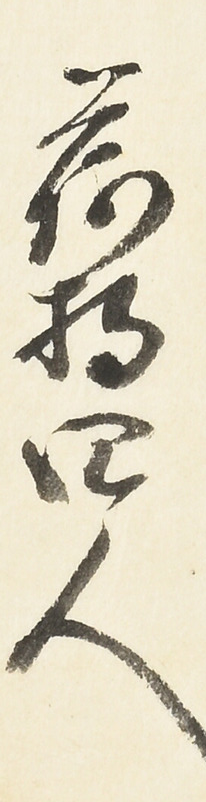荷持四人
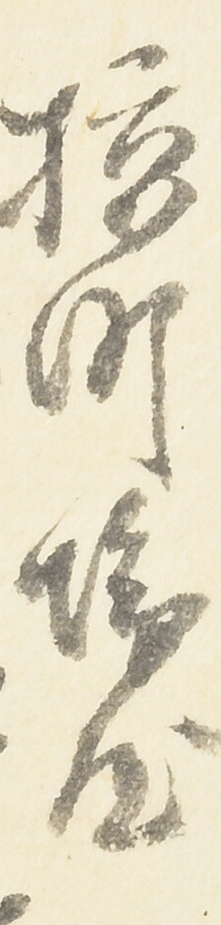横町塩屋
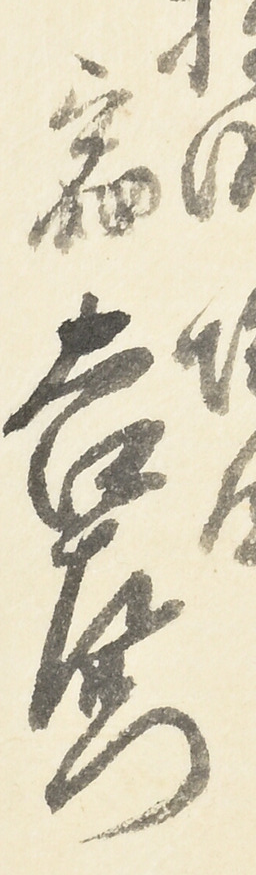宿吉左衛門
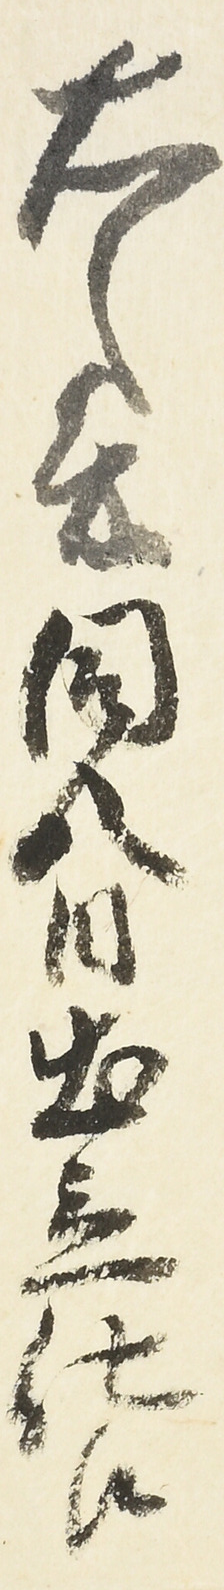右之者同八日出立仕候
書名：町中旅人泊控帳
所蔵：伊那市立高遠町図書館・合同会社AMANE
